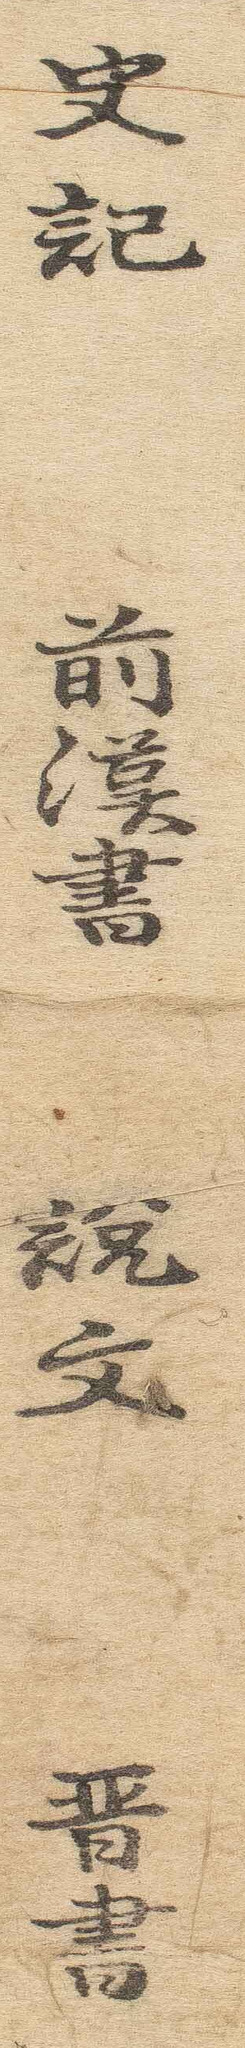史記前漢書説文晋書
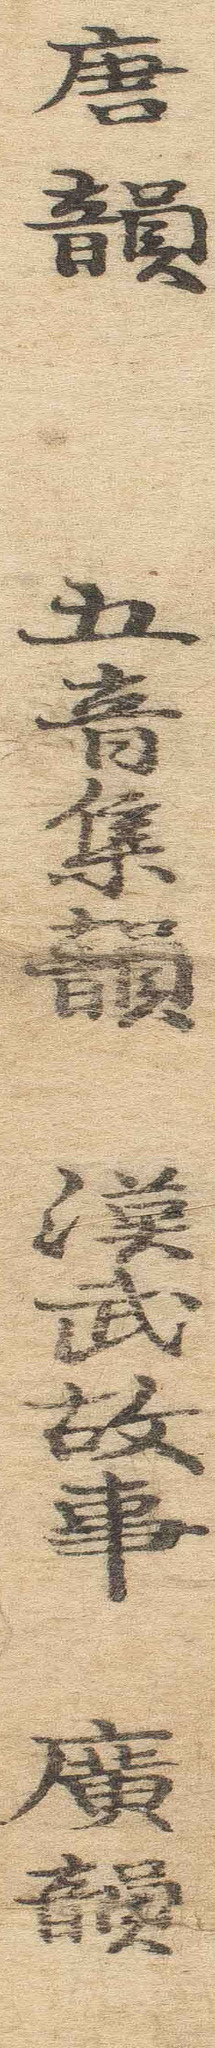唐韻五音集韻漢武故事広韻
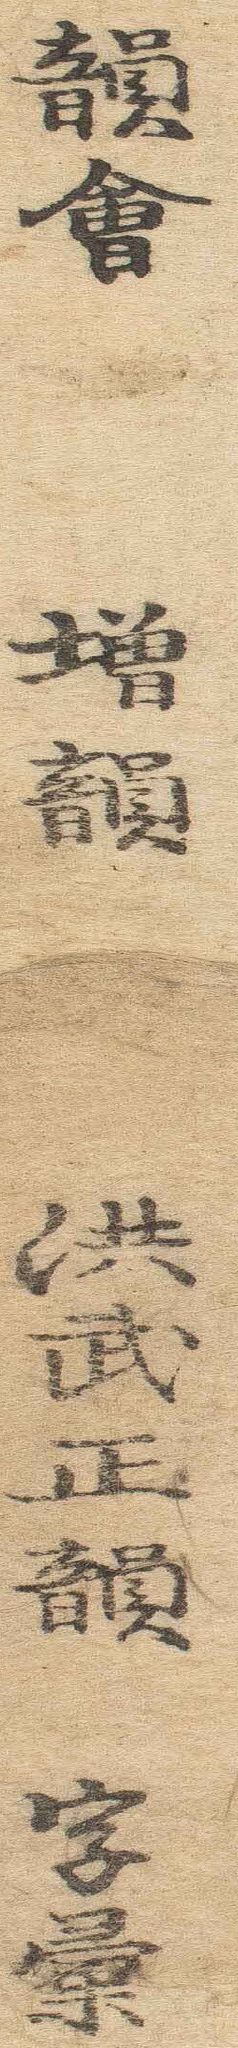韻会増韻洪武正韻字彙
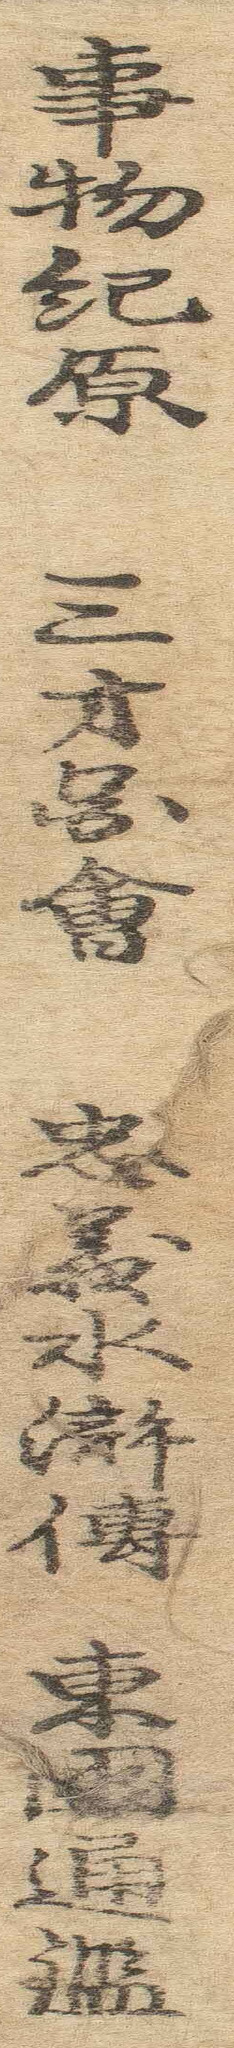事物紀原三才図会忠義水滸伝東国通鑑
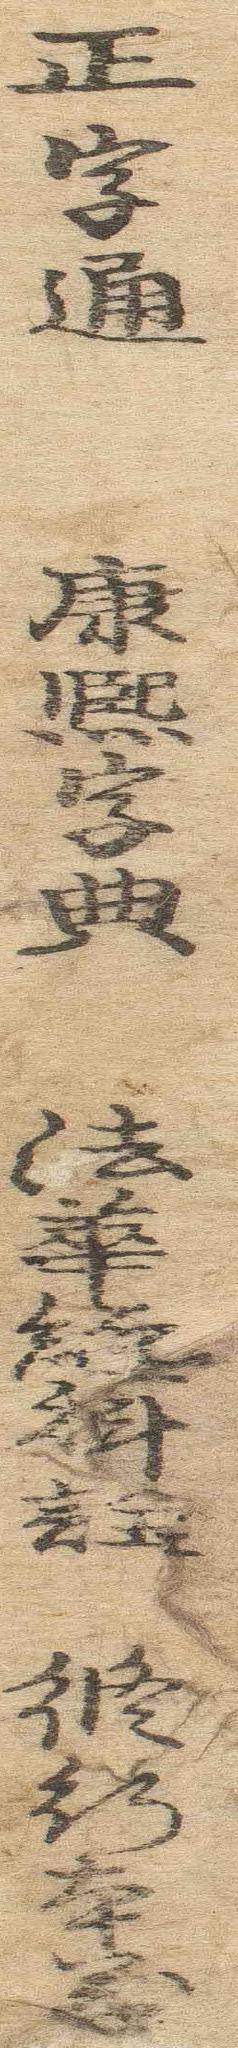正字通康煕字典法華経科註修行本義
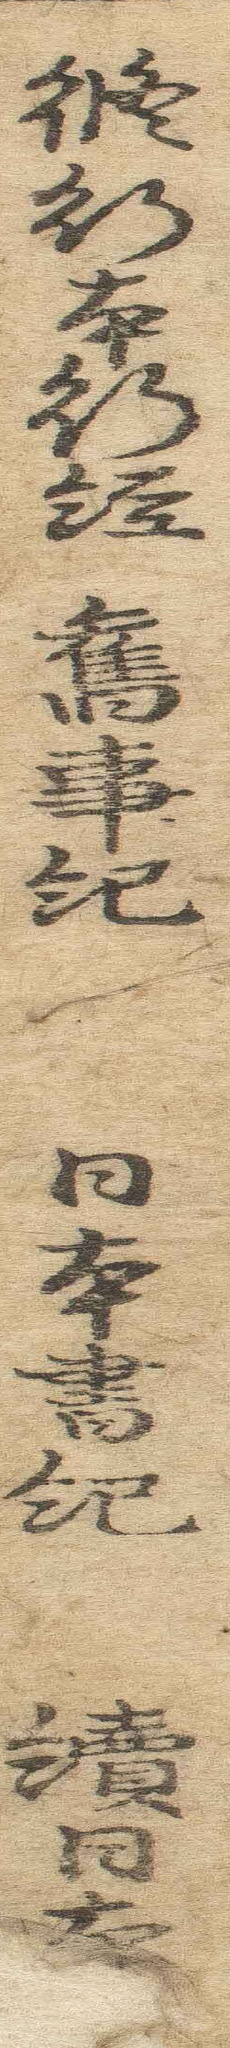修行本行経旧事紀日本書紀続日本
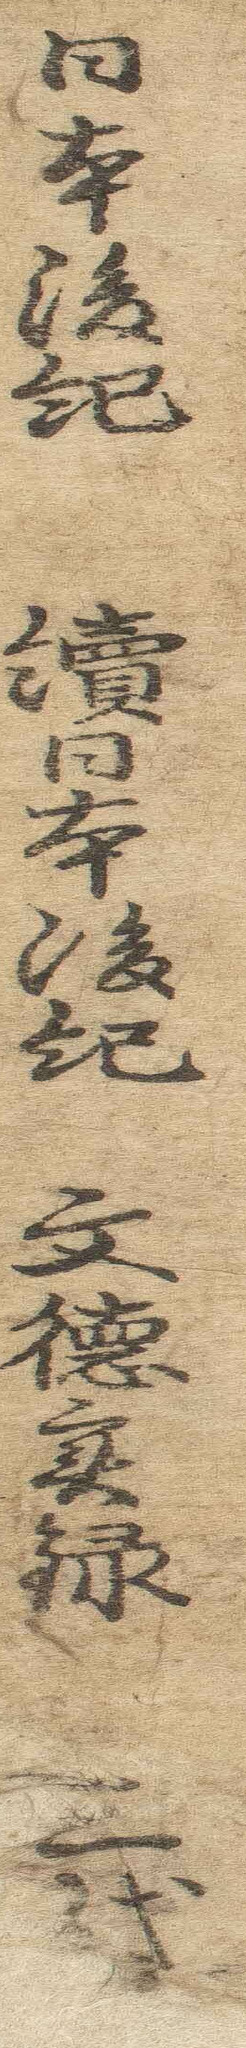日本後紀続日本後紀文徳実録三代

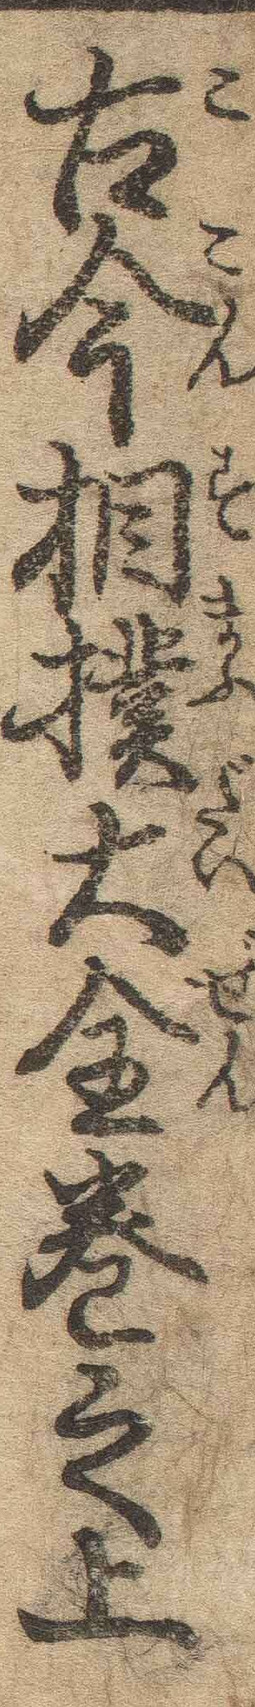古今相撲大全巻之上
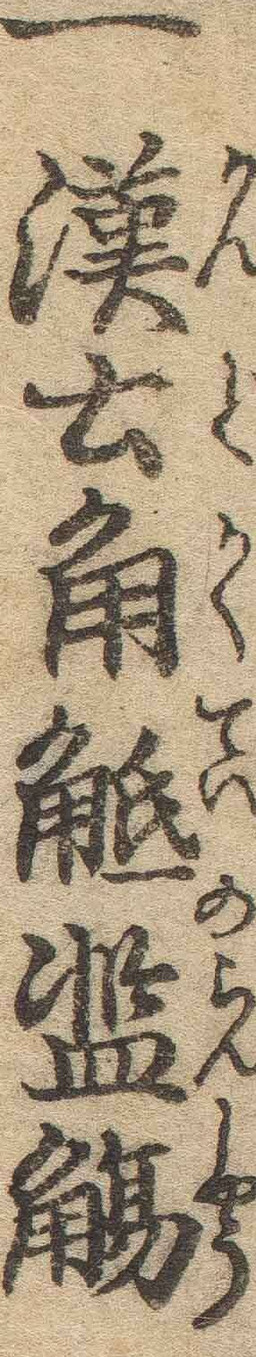一漢土角觝濫觴
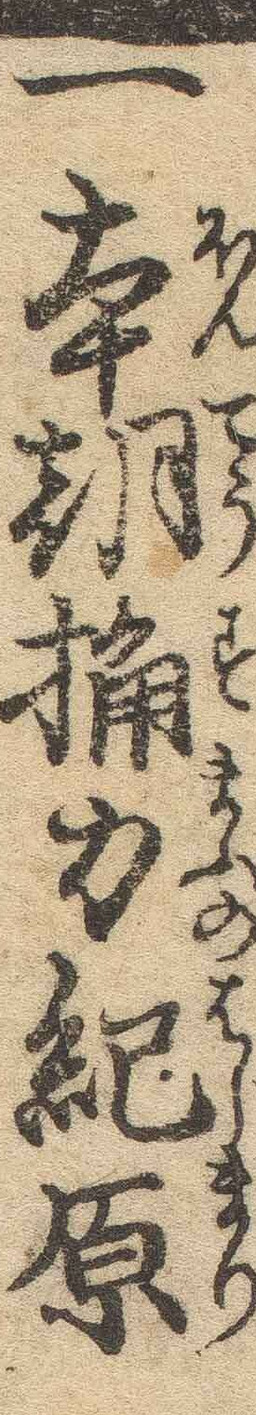一本朝捔力紀原
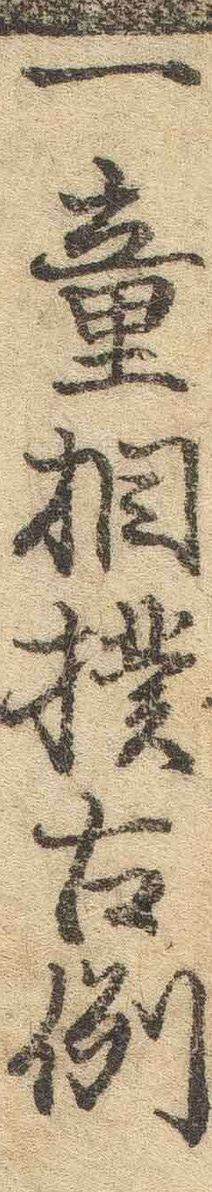一童相撲古例
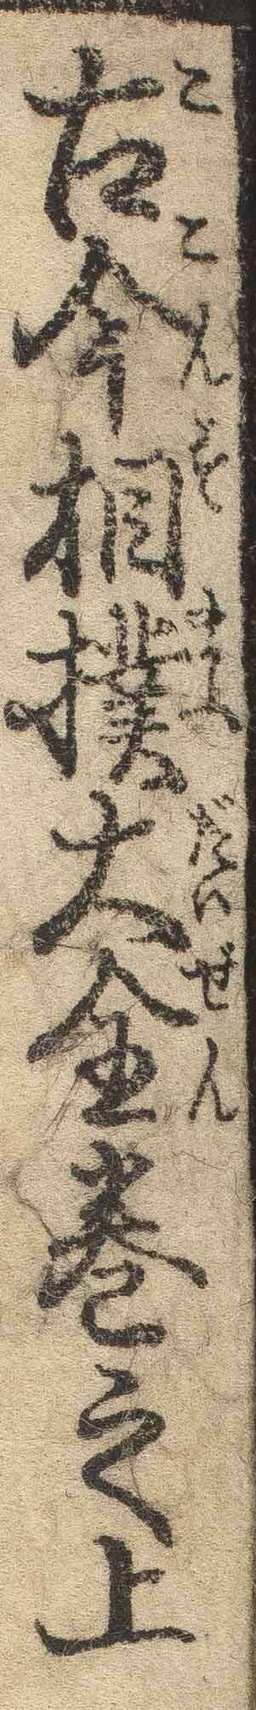古今相撲大全巻之上
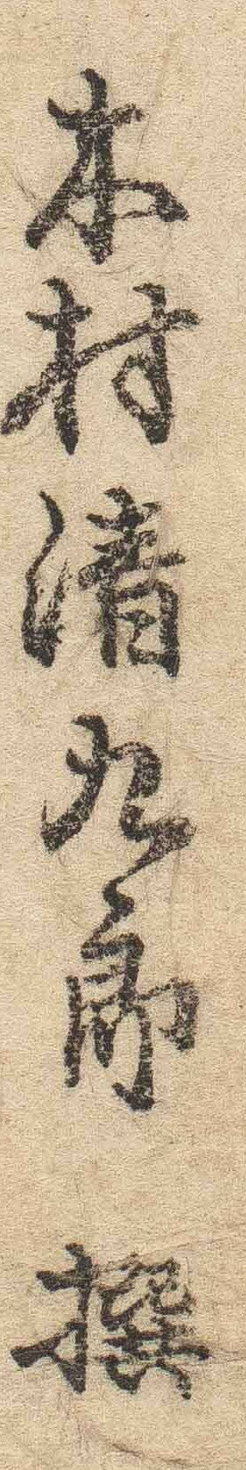木村清九郎撰

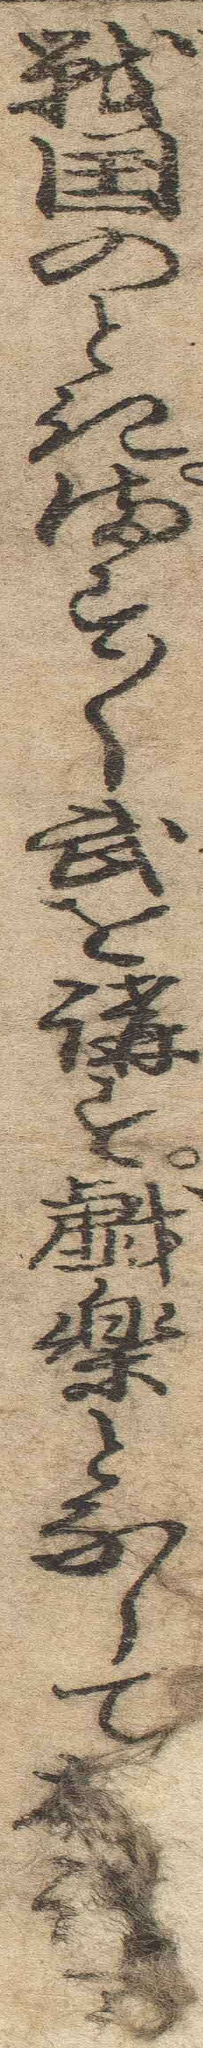戦国のとき。ます〳〵武を講す。戯楽となして相誇り。其力を
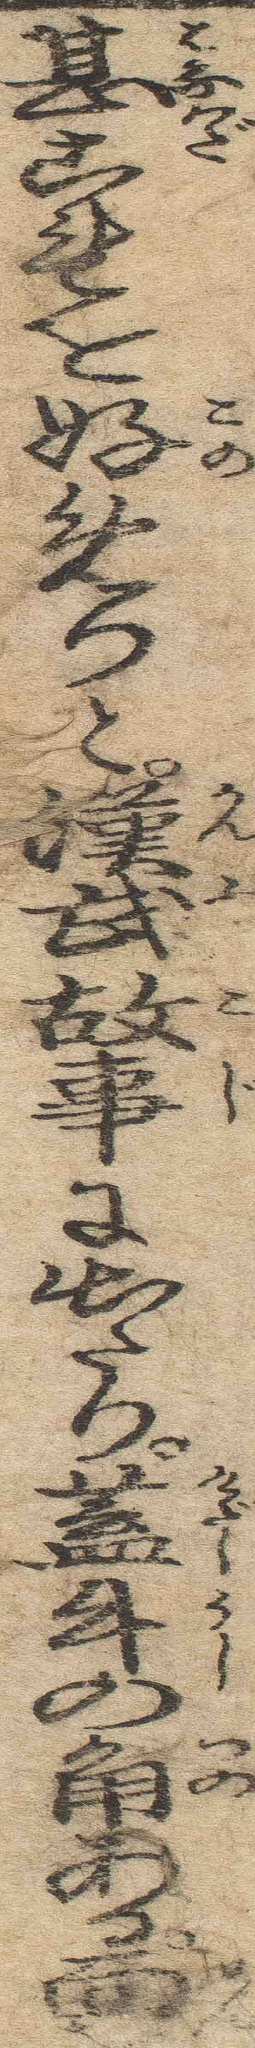甚これを好めりと。漢武故事に出たり。蓋牛の角ある。面を
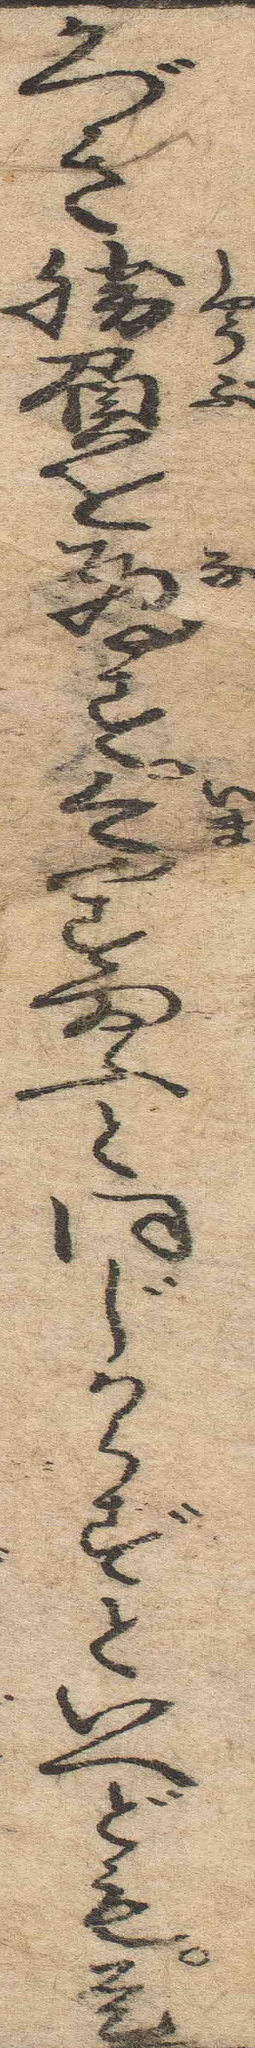かづき勝負を為す。今のすまふと同じからずといへども。是
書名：古今相撲大全
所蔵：東京学芸大学附属図書館 国文学研究資料館
